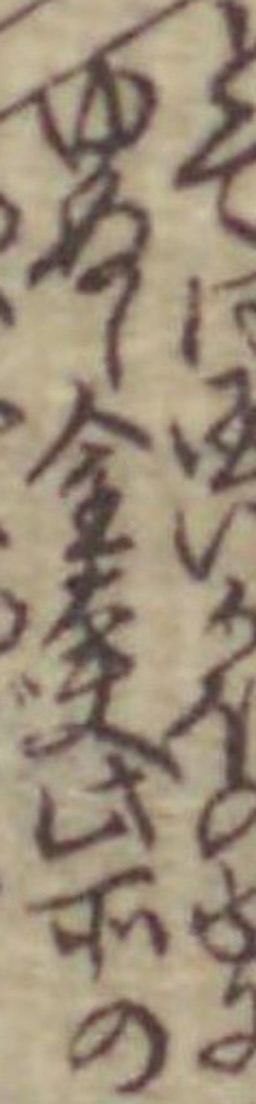ゆぬし金太夫此所の
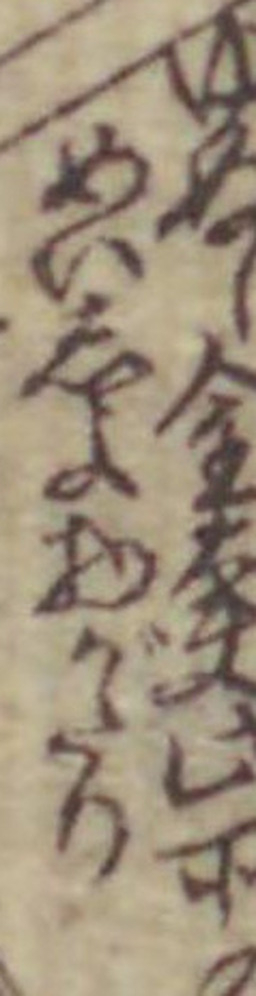めいしよ物がたり
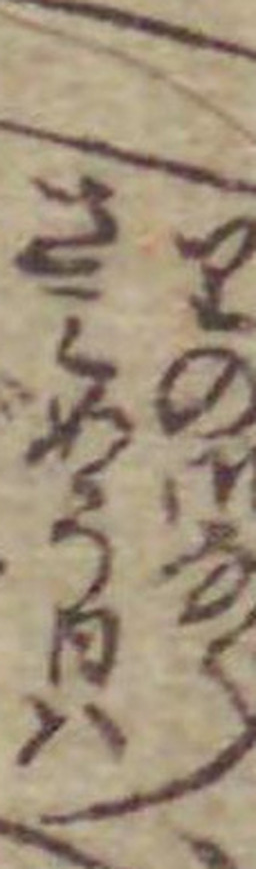さみめう日は
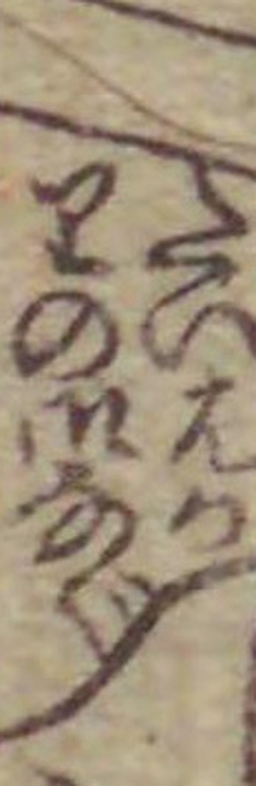りの御なぐ
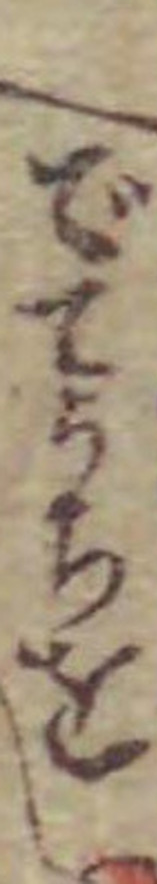でてうちを
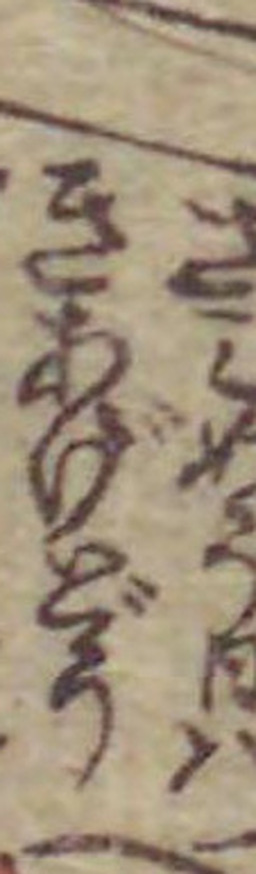きあげどう
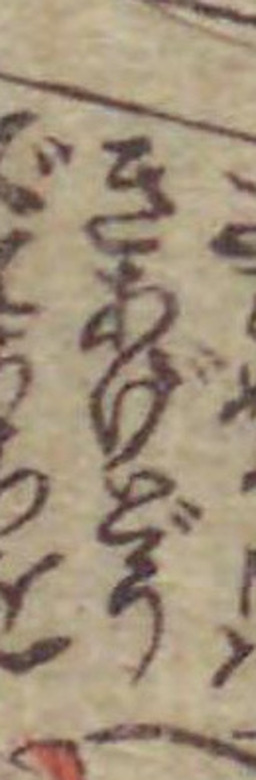きあげどう
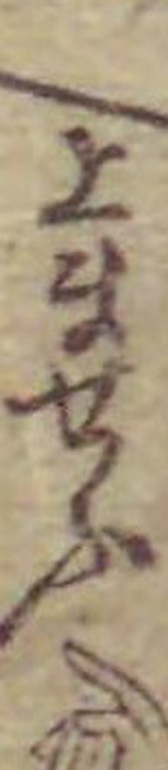上ませふ
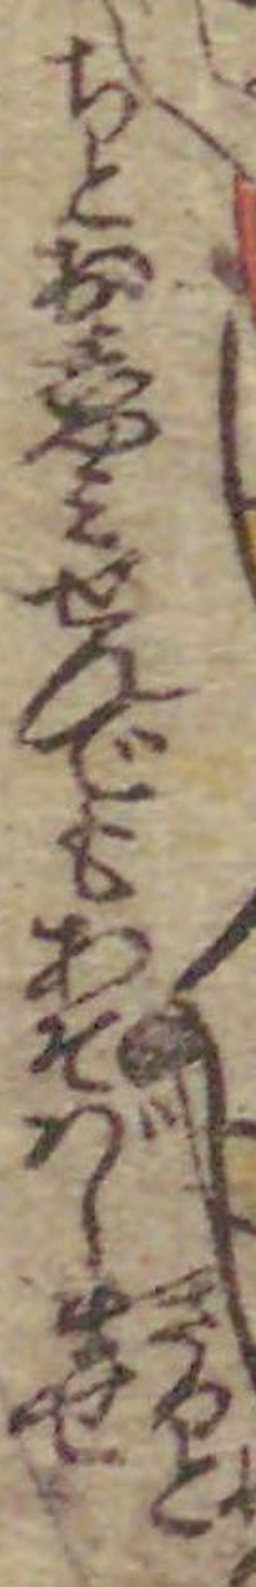ちとおしやみせんでもあそばしませふ

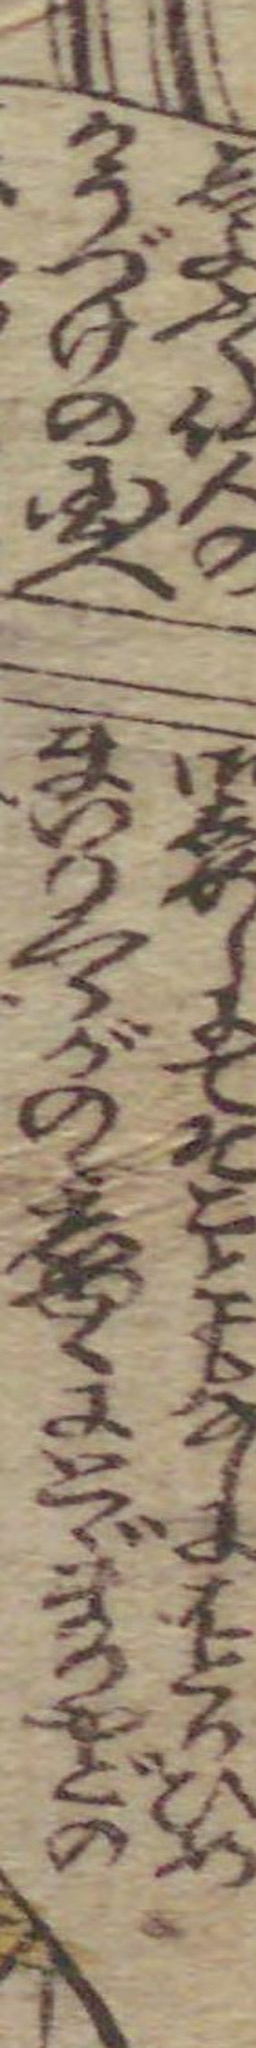かうづけの国へまいりくらがのしゆくにとゞまりやどの
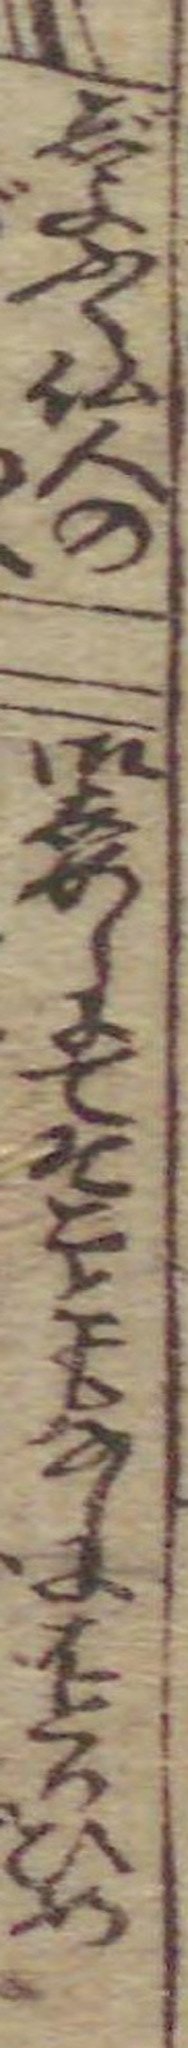じよふく仙人の御しめしにてそこともなしにはとりひめ
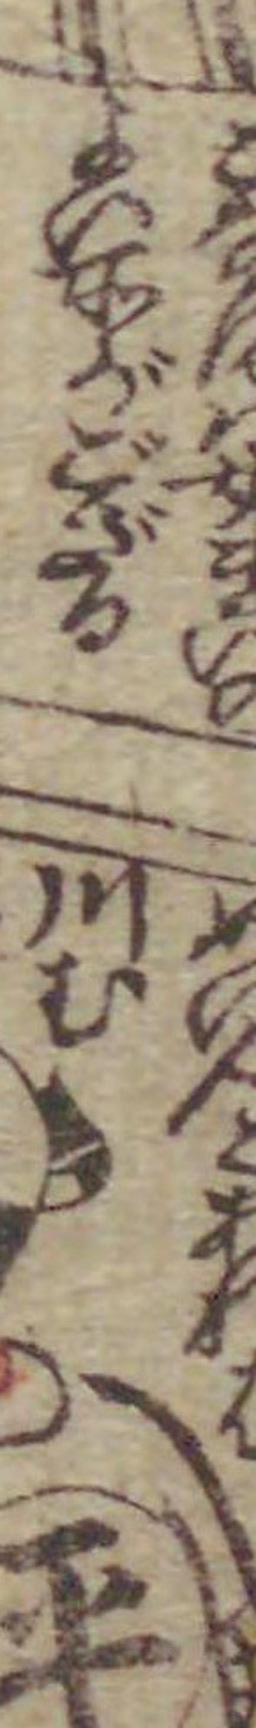よい所がござる川む
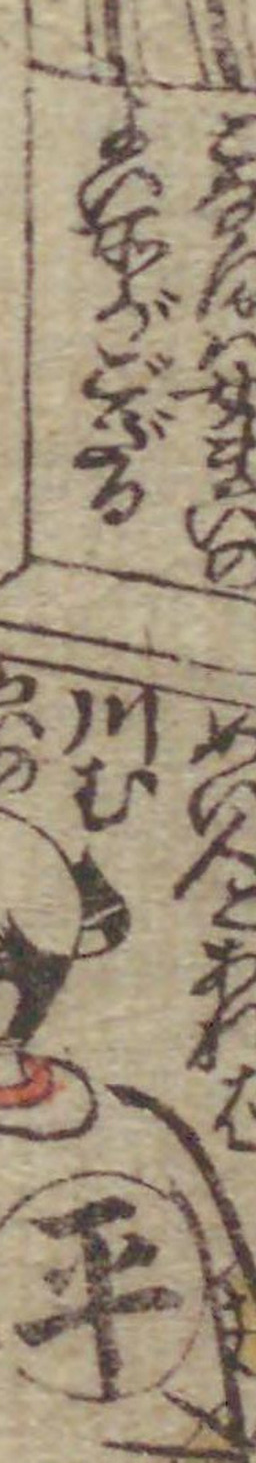よい所がござる川む
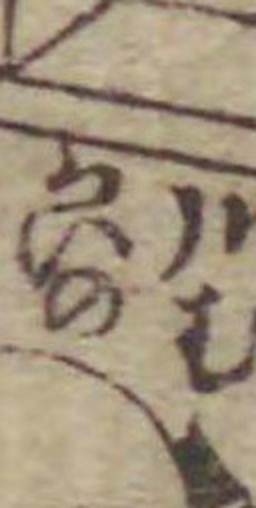かいの
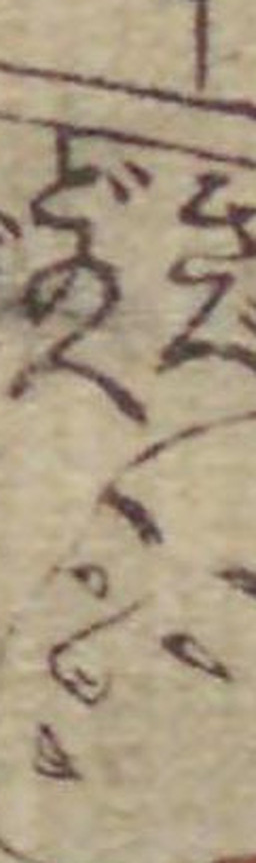どのへ
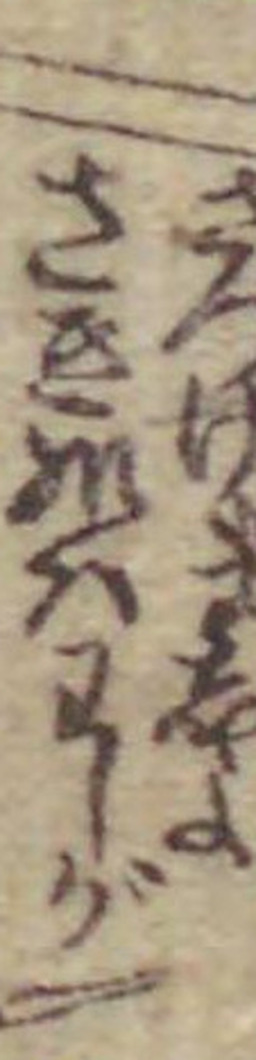さき様はわしが
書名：娜二代鉢木 5巻
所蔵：国立国会図書館 National Diet Library, JAPAN
